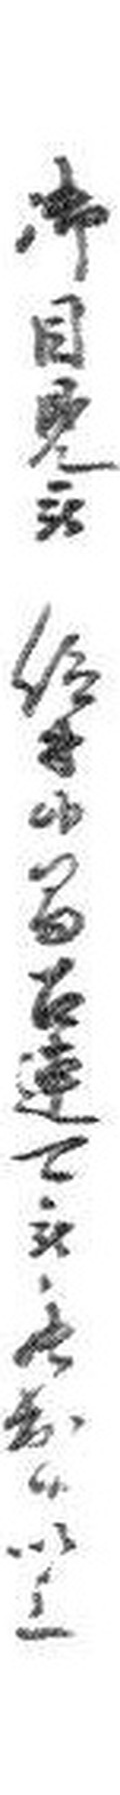御目見被仰付候間召連可被罷出候以上

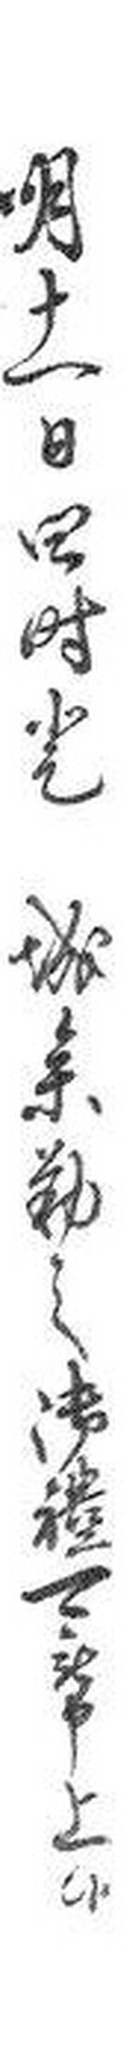明十一日四時登城参勤之御礼可被申上候
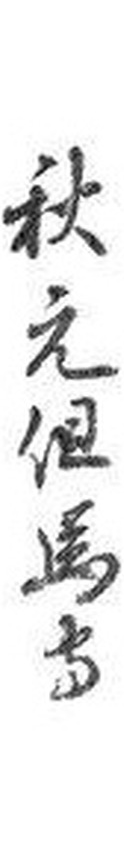秋元但馬守
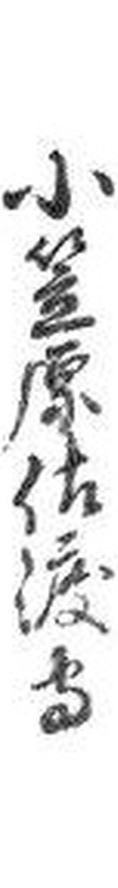小笠原佐渡守
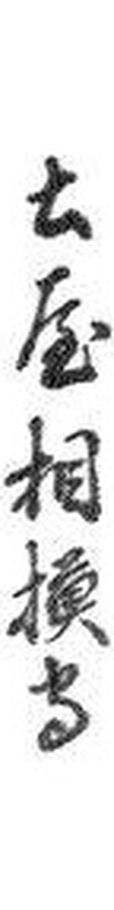土屋相模守
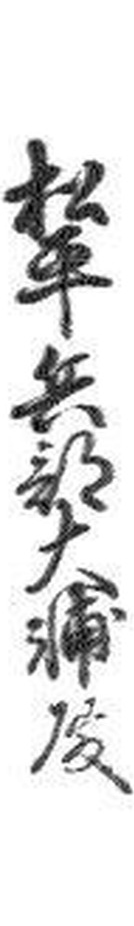松平兵部大輔殿
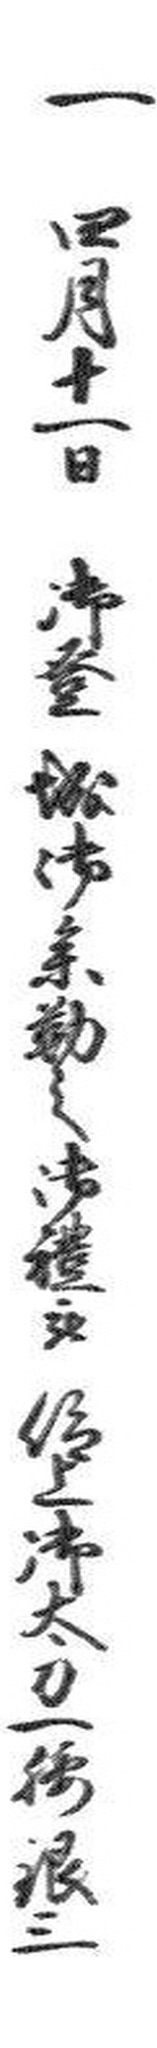一四月十一日御登城御参勤之御礼被仰上御太刀一腰銀三
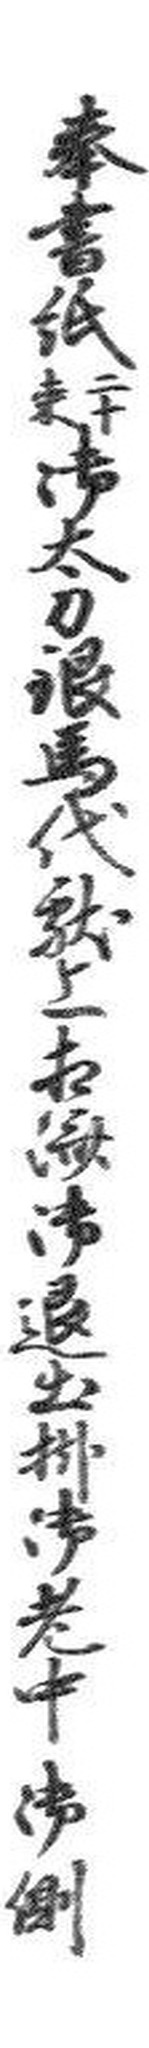束御太刀銀馬代献上相済御退出掛御老中御側
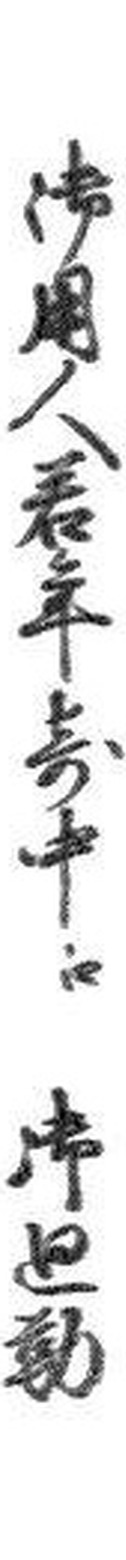御用人若年寄中江御廻勤
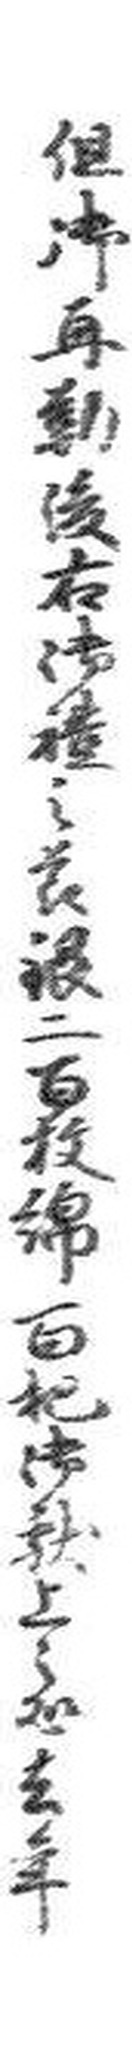但御再勤後右御礼之節銀二百枚綿百把御献上之処去年
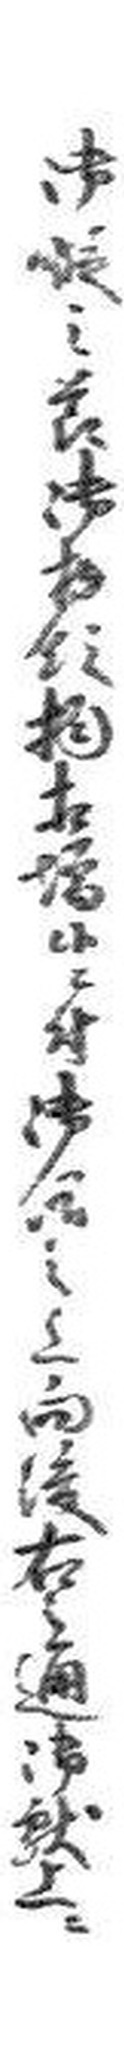御暇之節御拝領物相増候ニ付御伺之上向後右之通御献上ニ
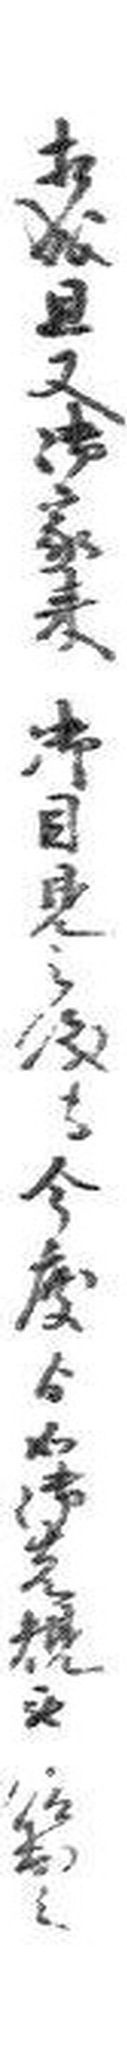相成且又家来御目見之儀も今度ゟ如御先規被仰出之
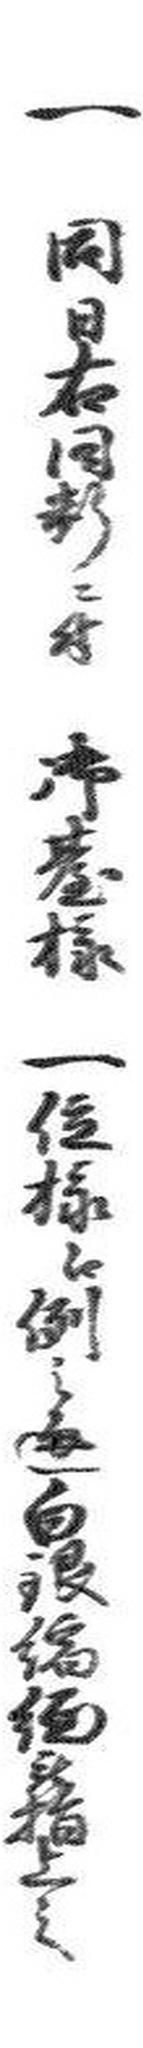一同日右同断ニ付御台様一位様江例之通白銀縮緬被指上之
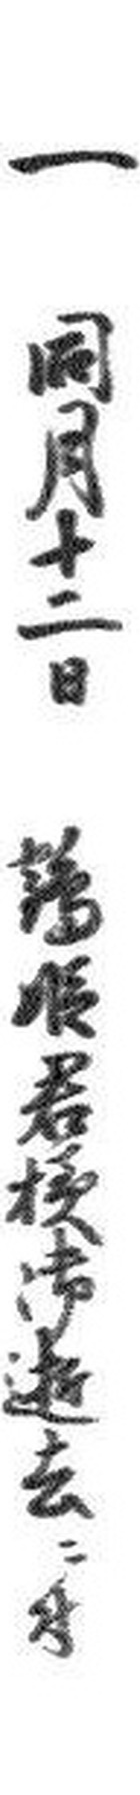一同月十二日鶴姫君様御逝去ニ付

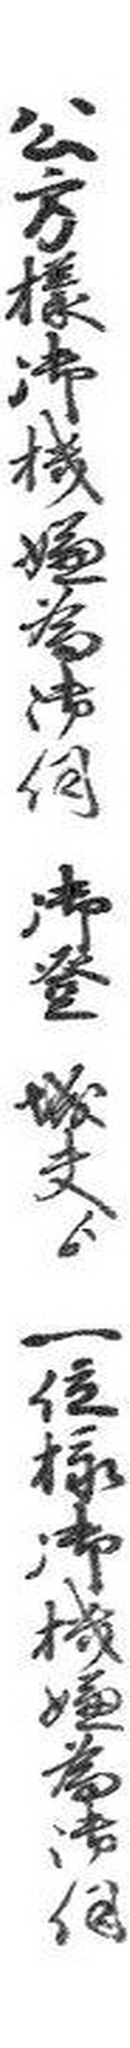公方様御機嫌為御伺御登城ゟ一位様御機嫌為御伺
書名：家譜 二十三 吉品公 従宝永元年到同二年
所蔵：福井県文書館 Fukui Prefectural Archives
